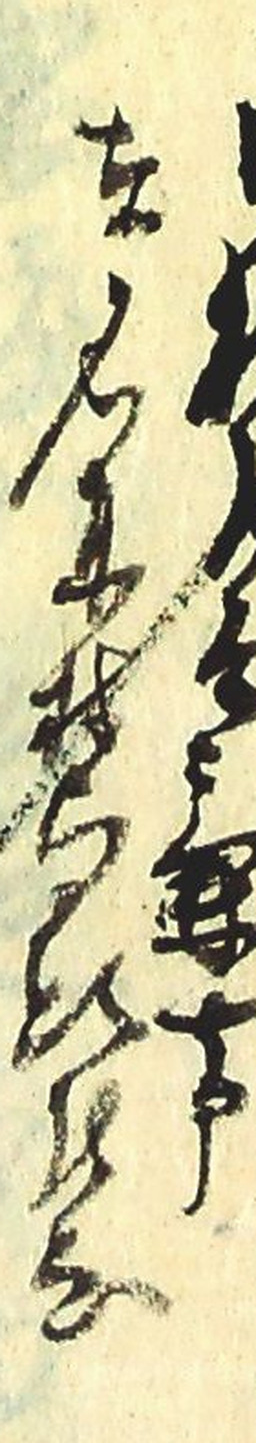東名東村与頭庄屋
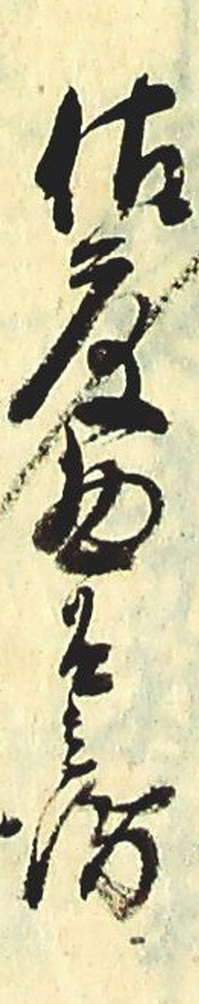佐藤惣太兵衛
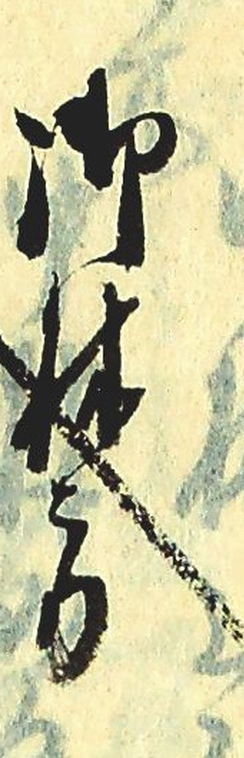御林方
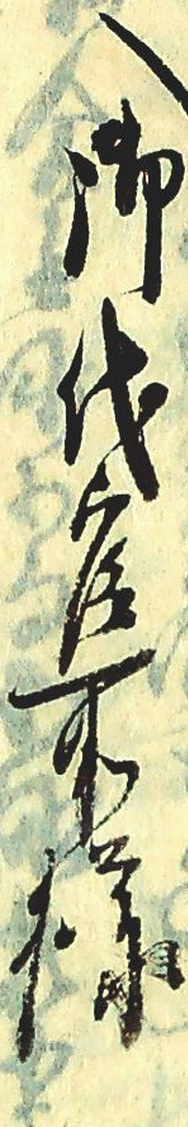御代官所様
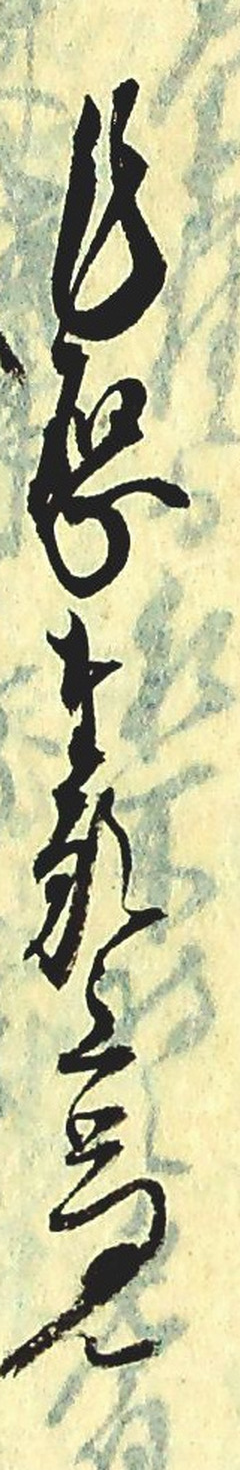乍恐奉願上覚
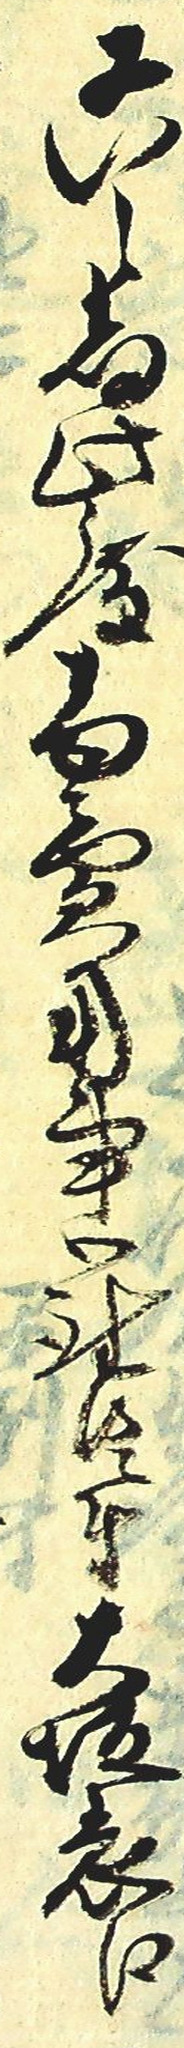右之者此度商売用事御座候に付大坂表え
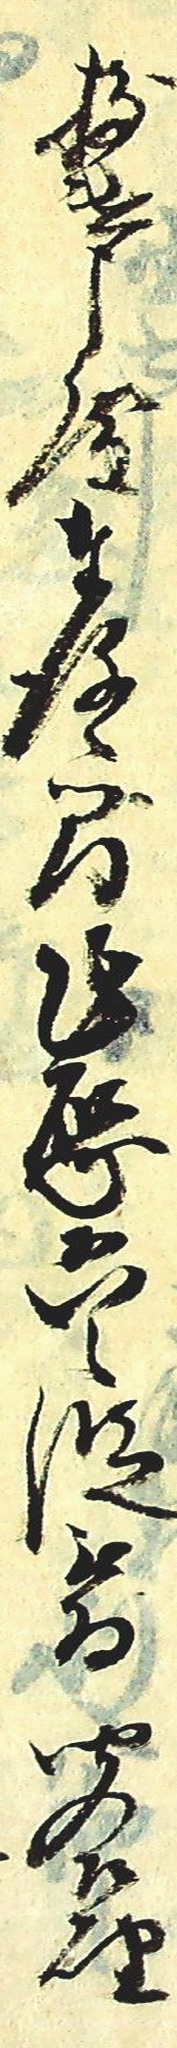指遣申度奉存候間乍恐右之段被為聞召届
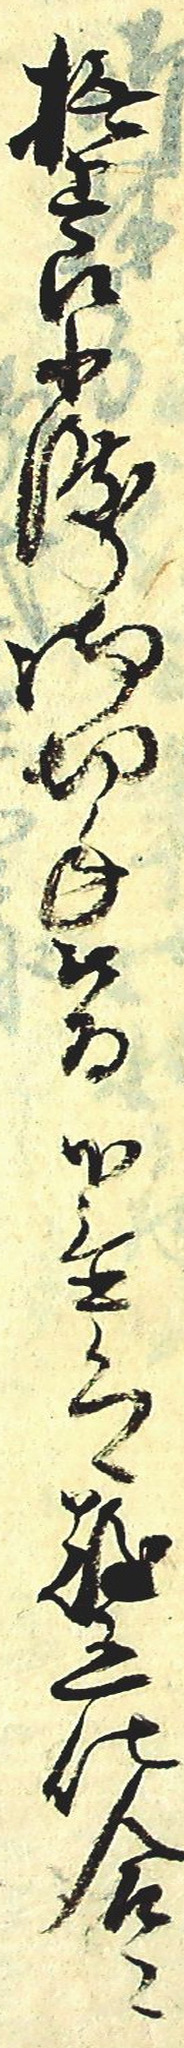撫養小渡り御切手被為下置候はゝ難有仕合に
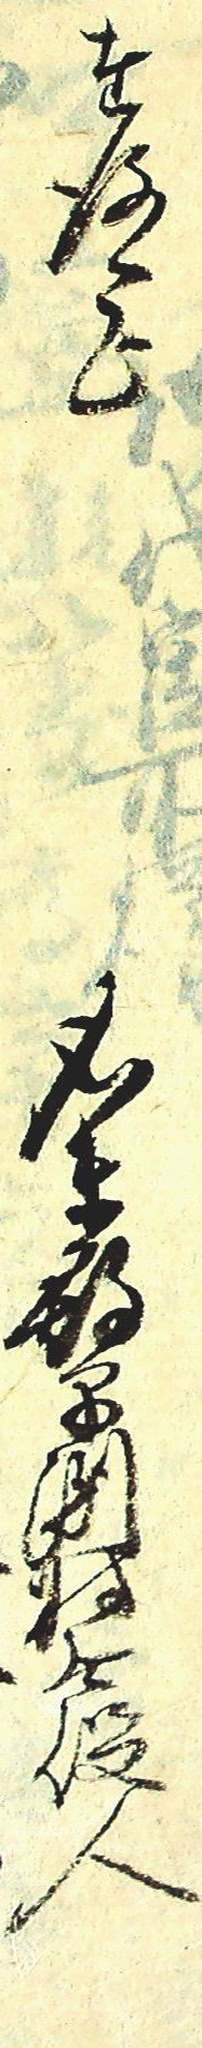奉存候名東郡早淵村無役人
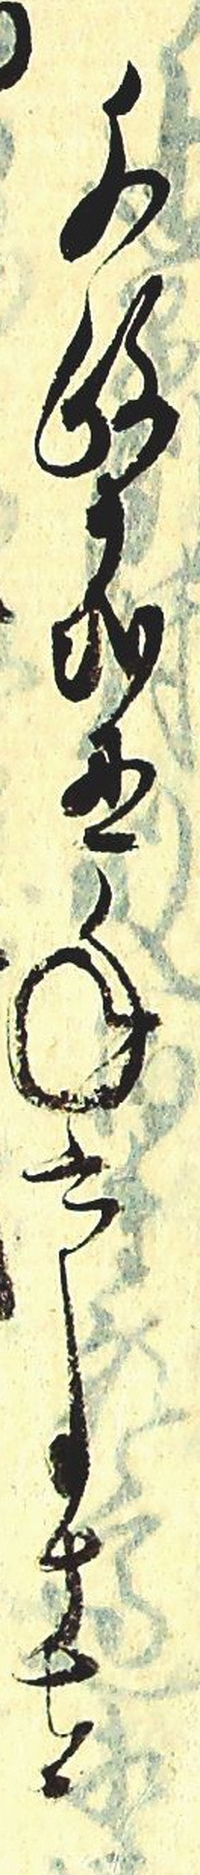文政十弍丑年六月十七日
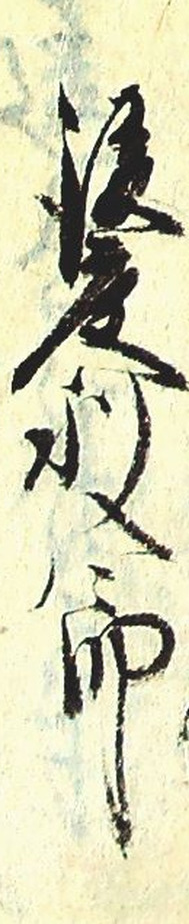後藤利八郎
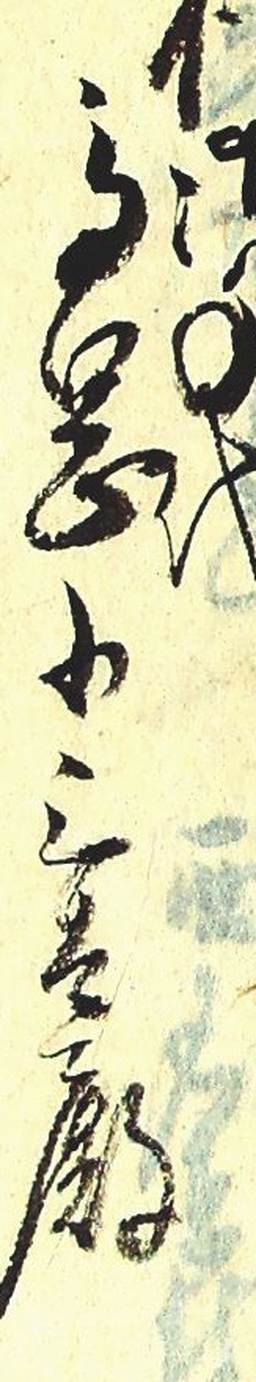高岡小三太殿

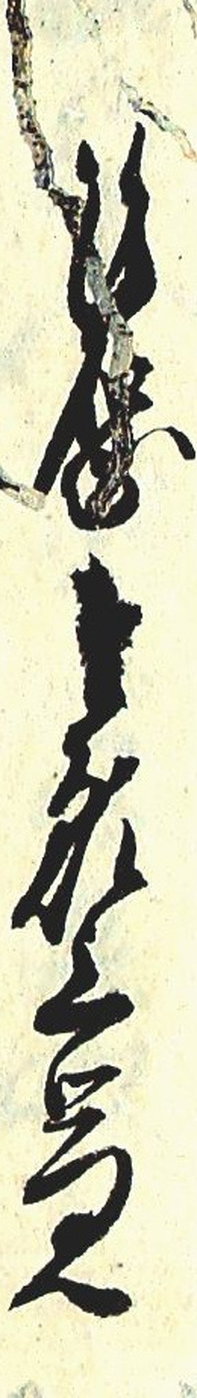乍恐奉願上覚
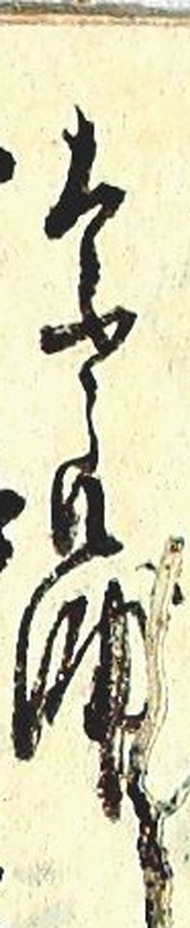奈良浦
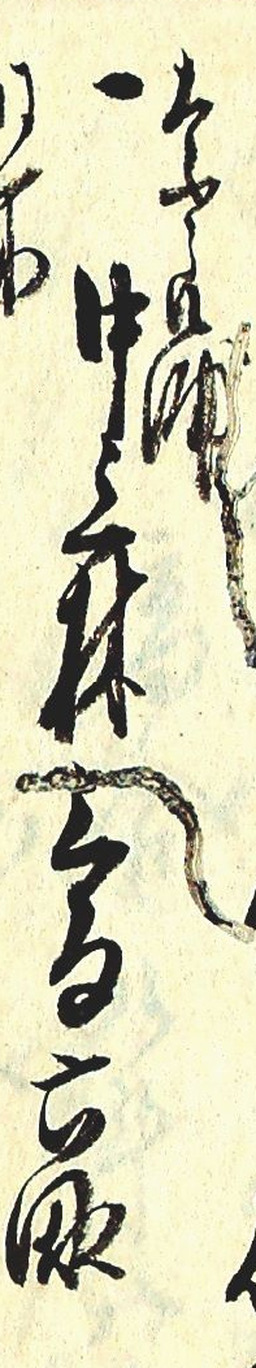一中上林三反六畝
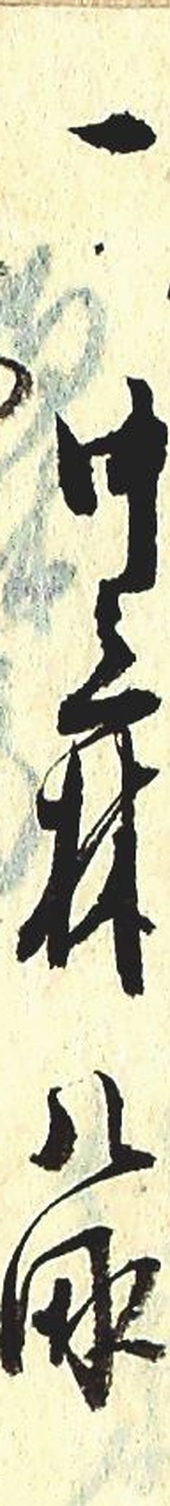一中上林八畝
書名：諸御願書控(弐番）
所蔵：鳴門教育大学 Naruto University of Education
